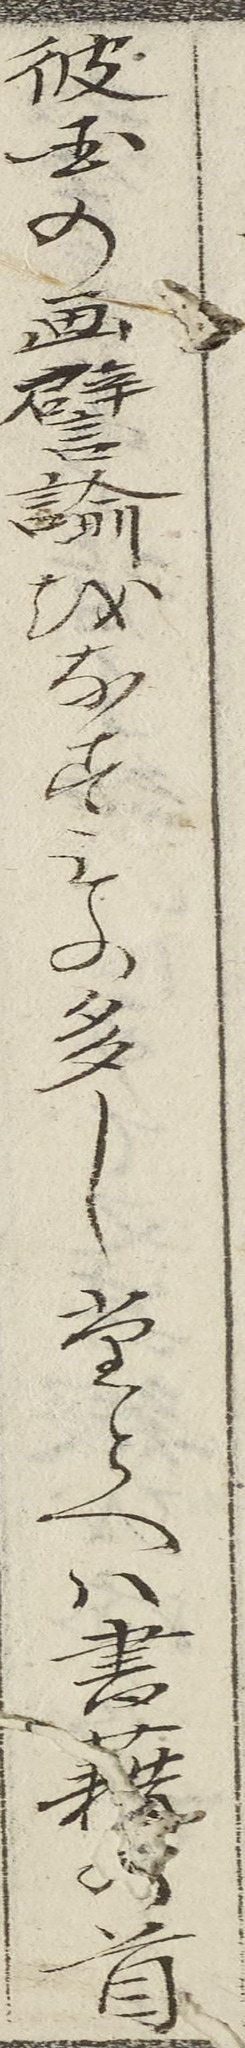彼国の画譬論をなすもの多したとへハ書籍の首
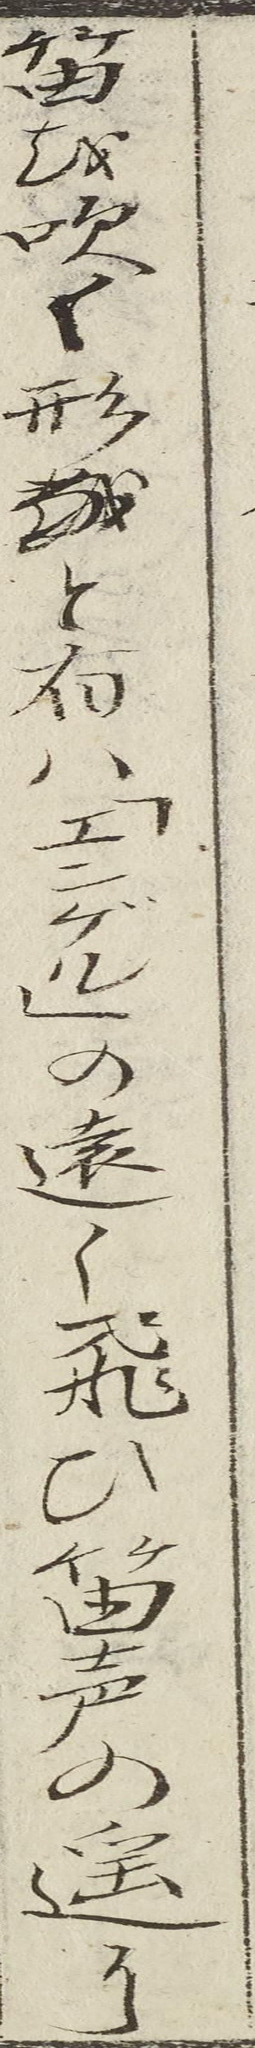笛を吹く形と有ハ「エンゲル」の遠く飛ひ笛声の遥に
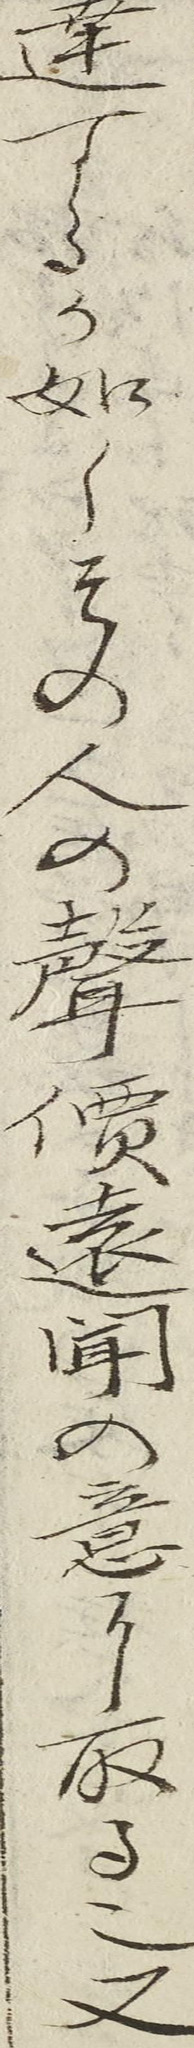達するか如くその人の声価遠聞の意に取る也又
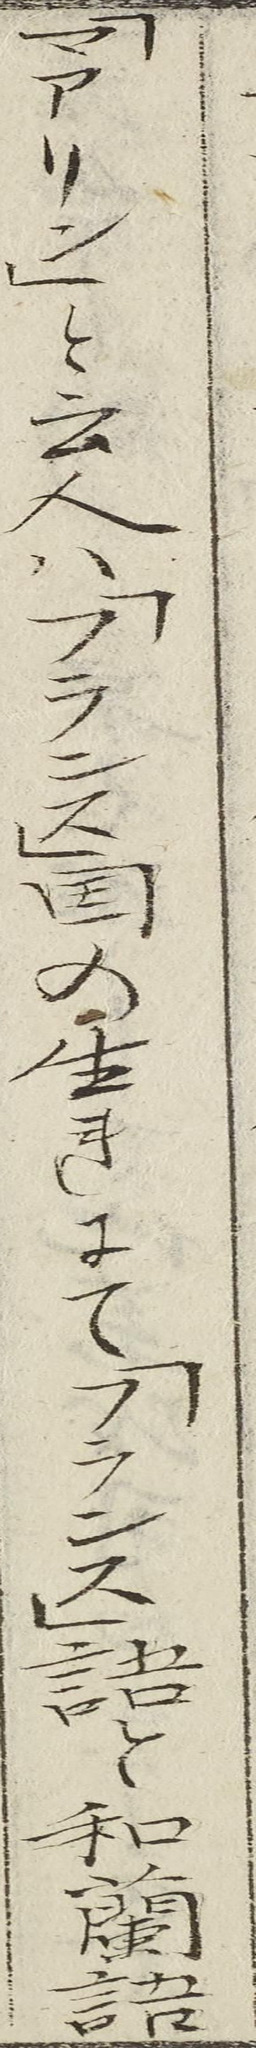「マアリン」と云人ハ「フランス」国の生れにて「フランス」語と和蘭語
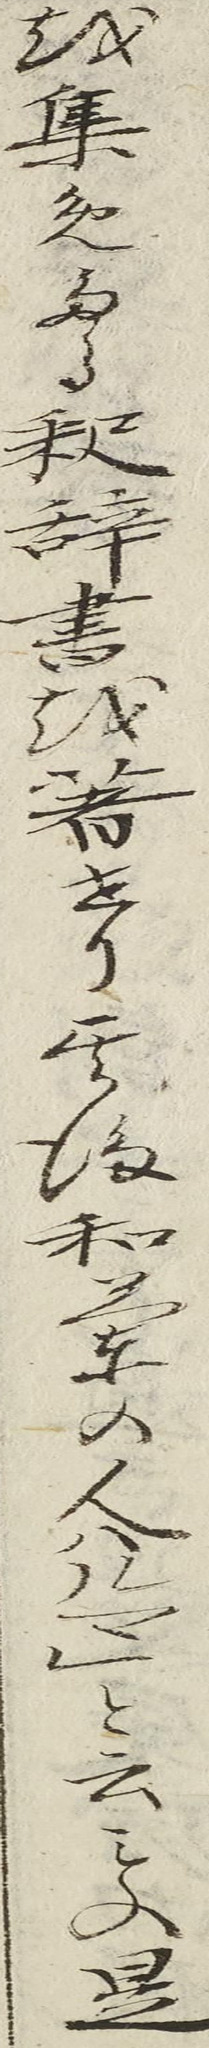を集めたる釈辞書を著せり其後和蘭の人「ハルマ」と云もの是
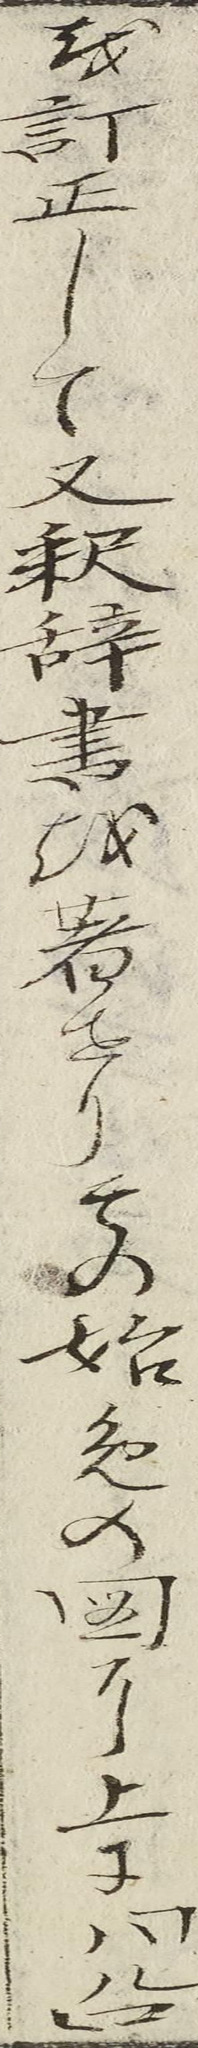を訂正して又釈辞書を著せりその始めの国に上に「ハルマ」
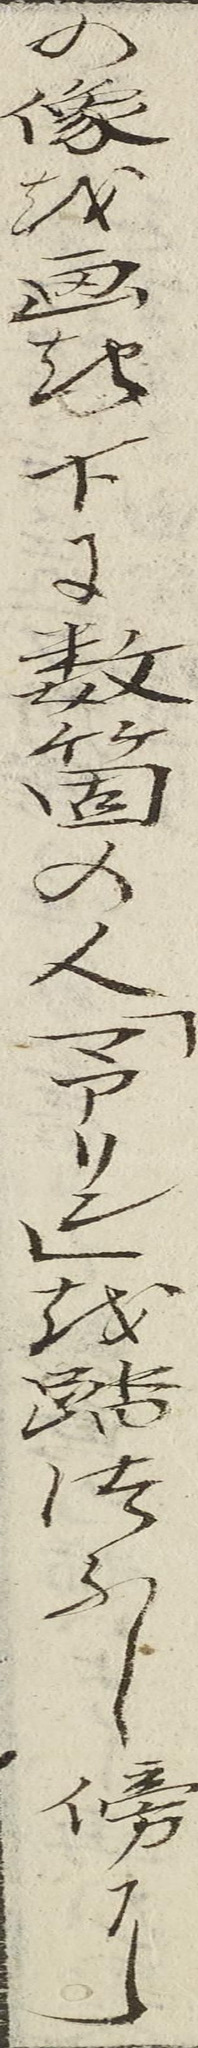の像を画の下に数箇の人「マアリン」を踏つふし傍に
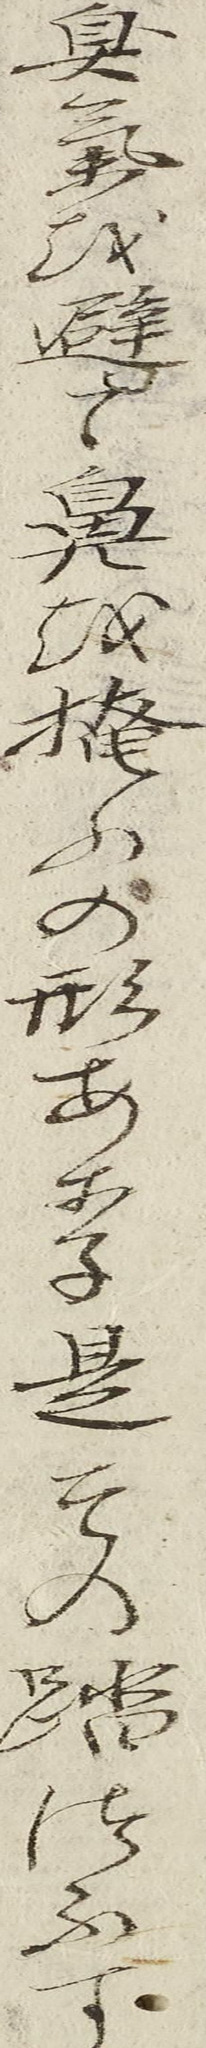臭気を避て鼻を掩ふの形あり是その踏つぶす
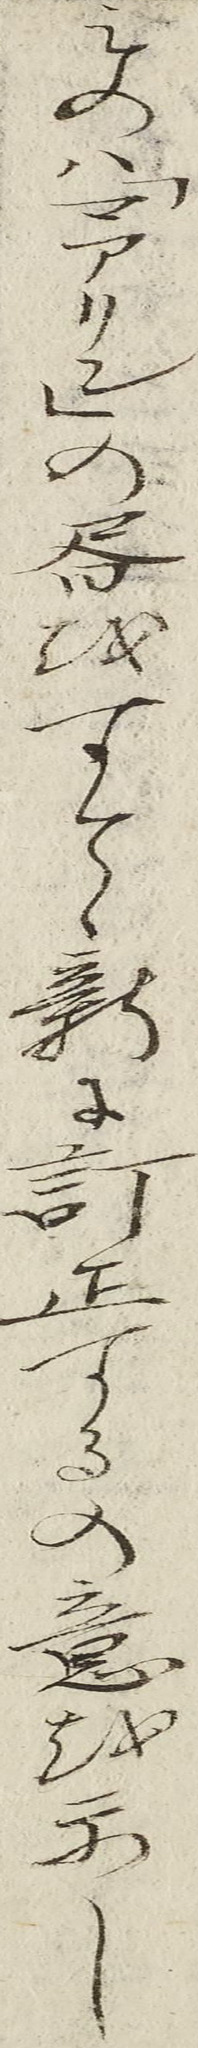ものハ「マアリン」の書をすてゝ新に訂正するの意を示し
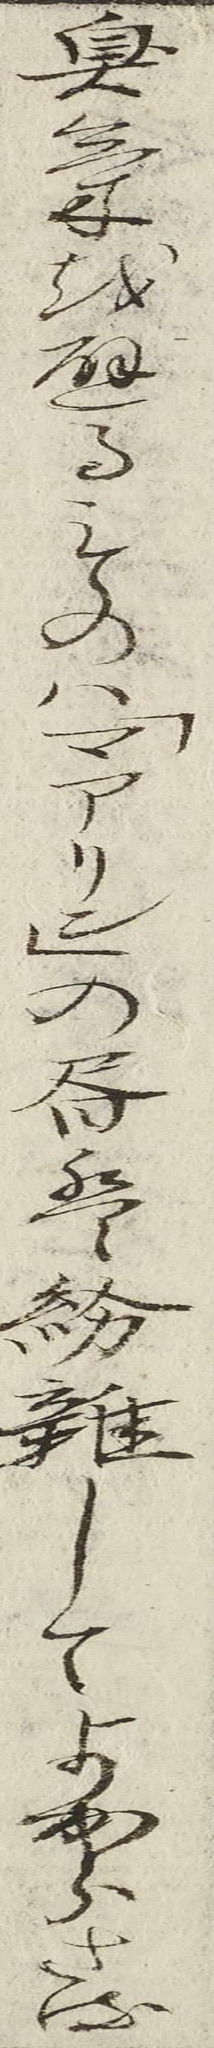臭気を避るものハ「マアリン」の書は紛雑してよからさる
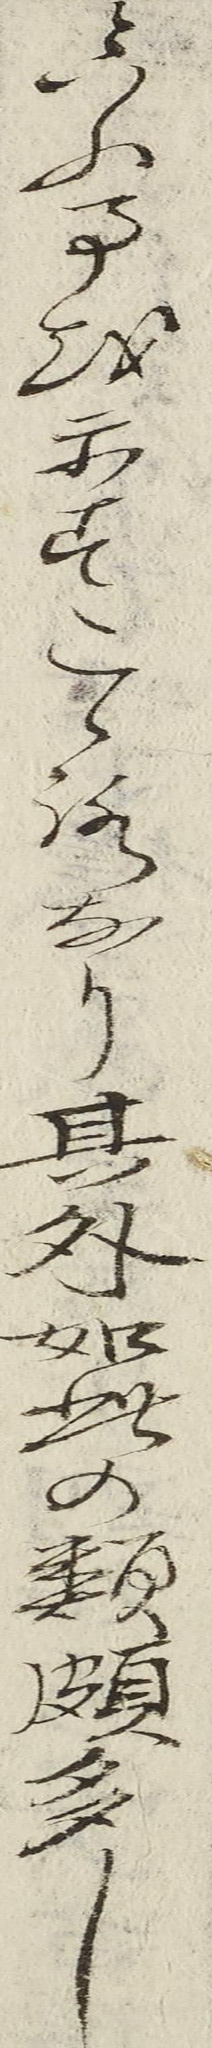といふ事を示すこゝろなり其外如此の類頗多し
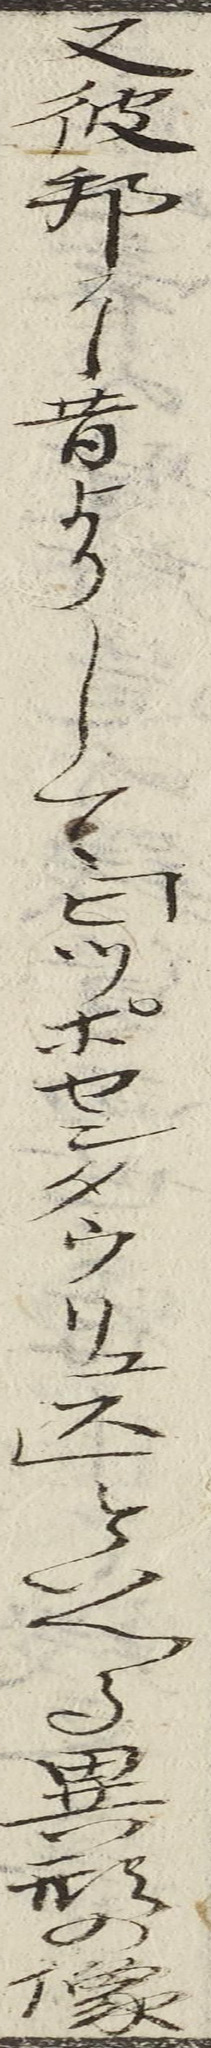又彼那に昔よりして「ヒツポセンタウリュス」といへる異形の像
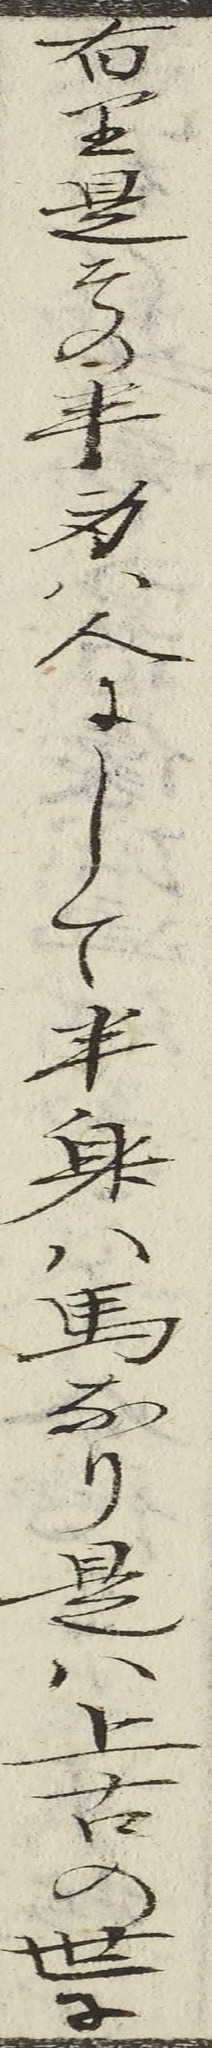有り是その半身ハ人にして半身ハ馬なり是ハ上古の世に
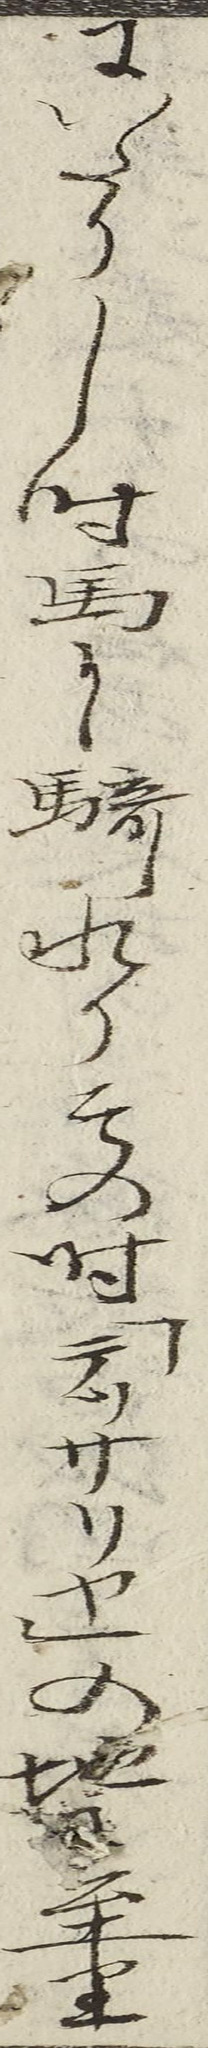にいたりし時馬に騎れりその時「テツサリヤ」の地に至り
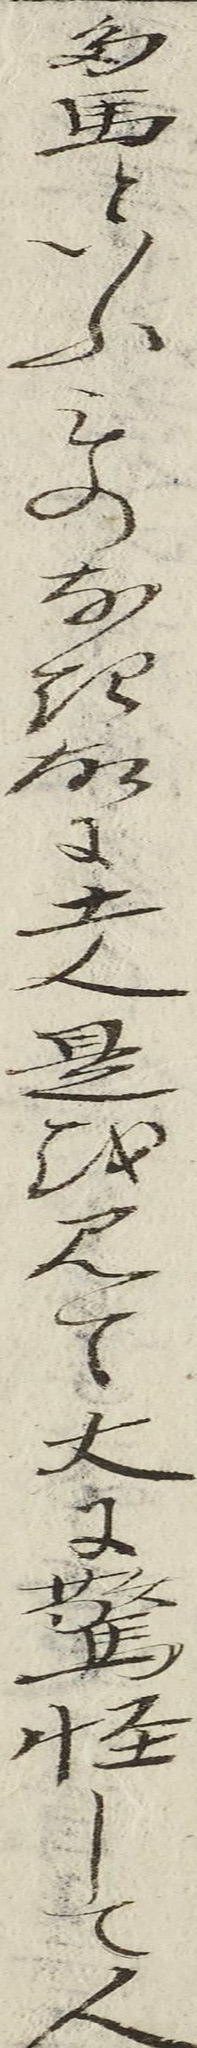た馬といふものなり故に土人是を見て大に驚怪して人
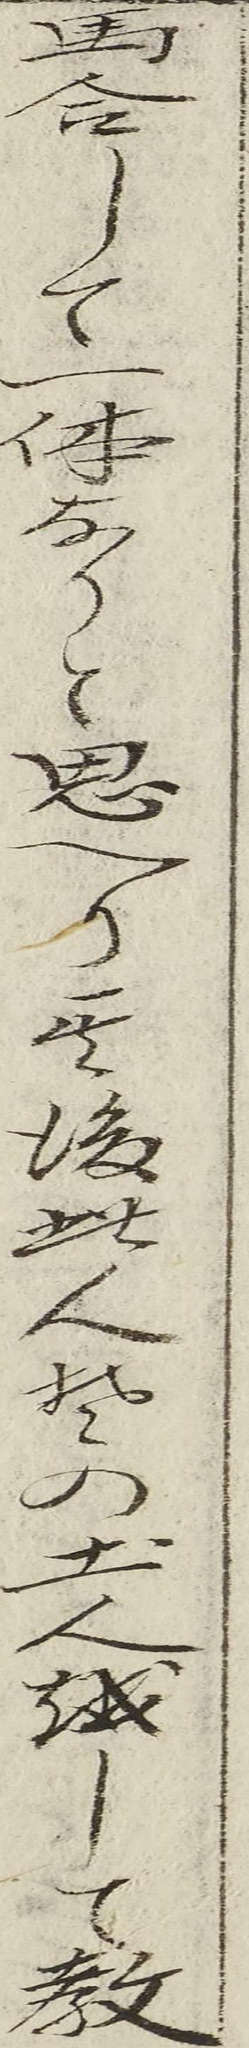馬合して一体なりと思へり其後此人その土人をして教
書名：西洋雜記　坤
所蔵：東京大学地震研究所図書室 Earthquake Research Institute Library, The University of Tokyo, JAPAN
